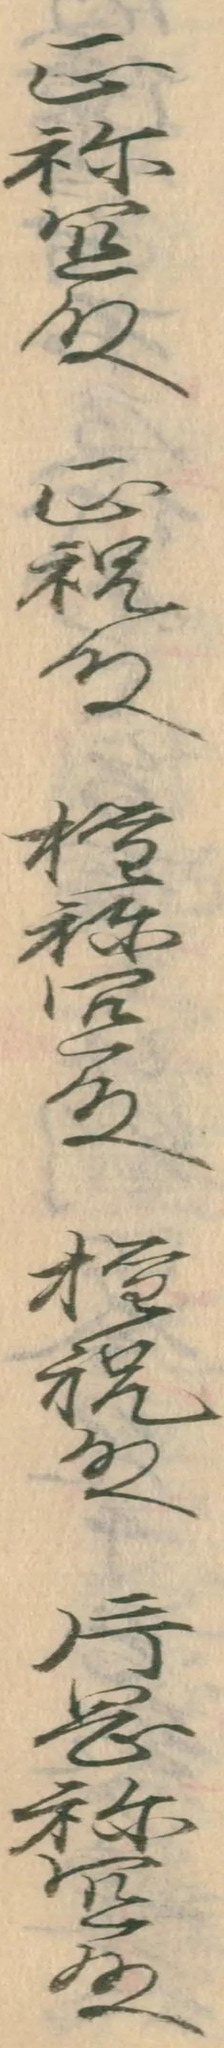正祢宜殿正祝殿権祢宜殿権祝殿片岡祢宜殿
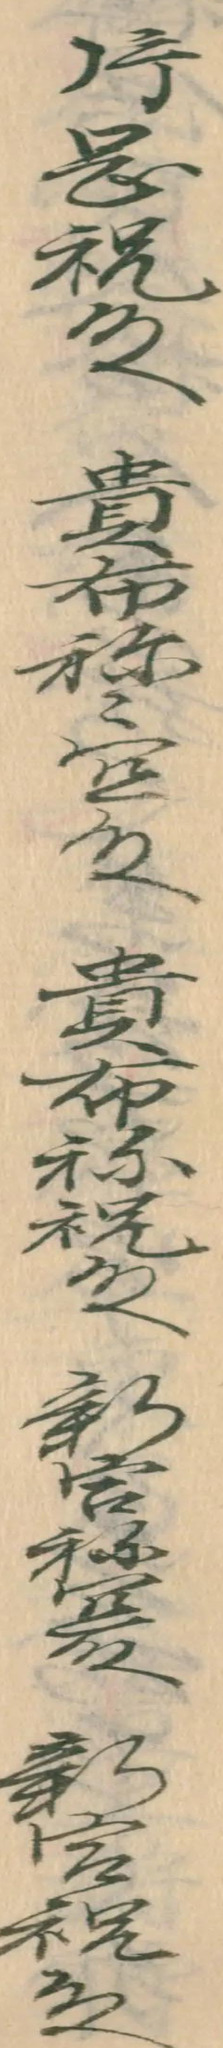片岡祝殿貴布祢々宜殿貴布祢祝殿新宮祢宜殿新宮祝殿
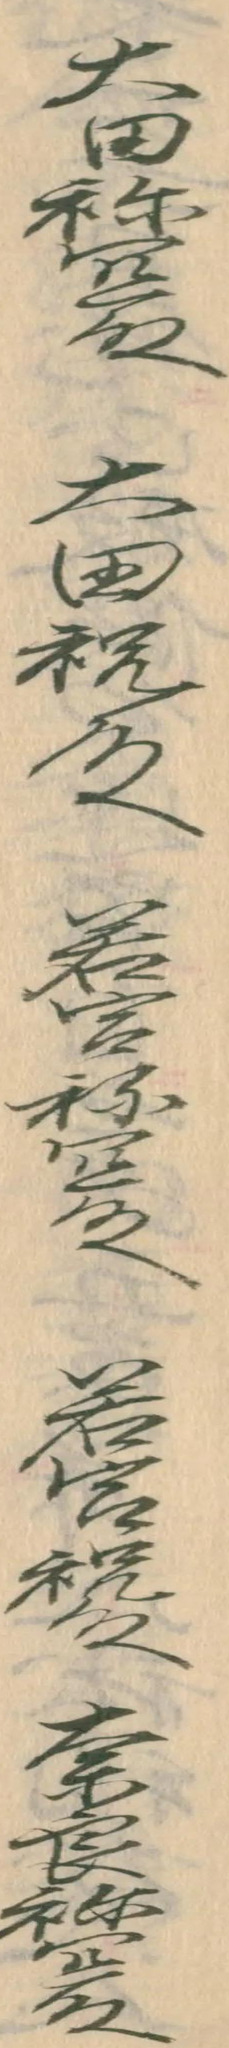大田祢宜殿大田祝殿若宮祢宜殿若官祝殿奈良祢宜殿
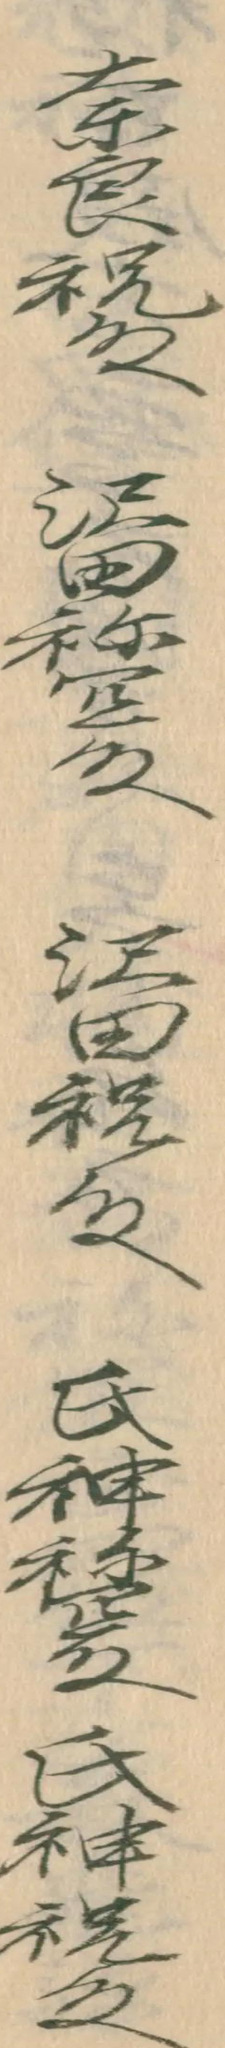奈良祝殿沢田祢宜殿沢田祝殿氏神祢宜殿氏神祝殿
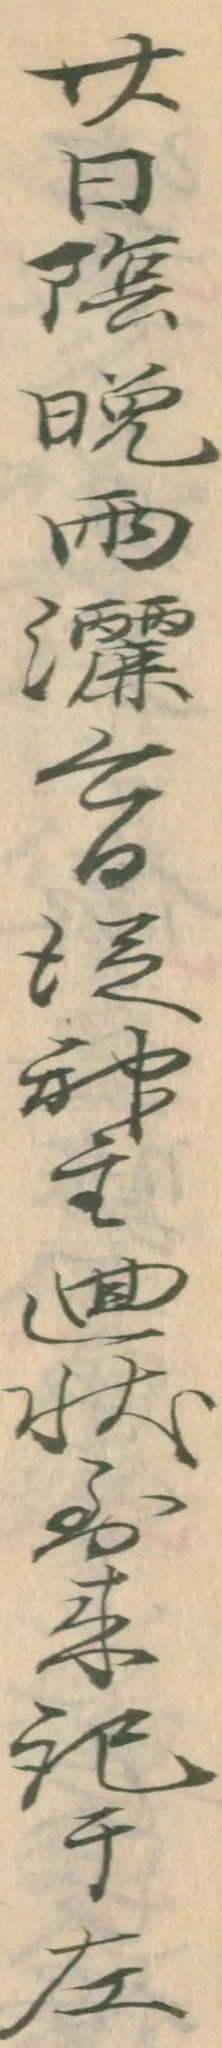廿日陰晩雨灑今日従神主廻状到来記于左
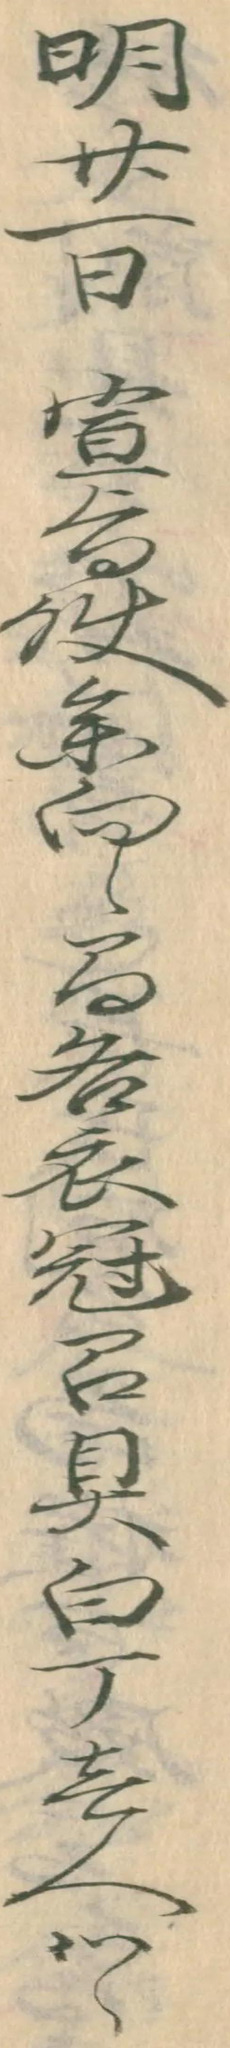明廿一日宣旨使参向候間各衣冠召具白丁壱人ツヽ
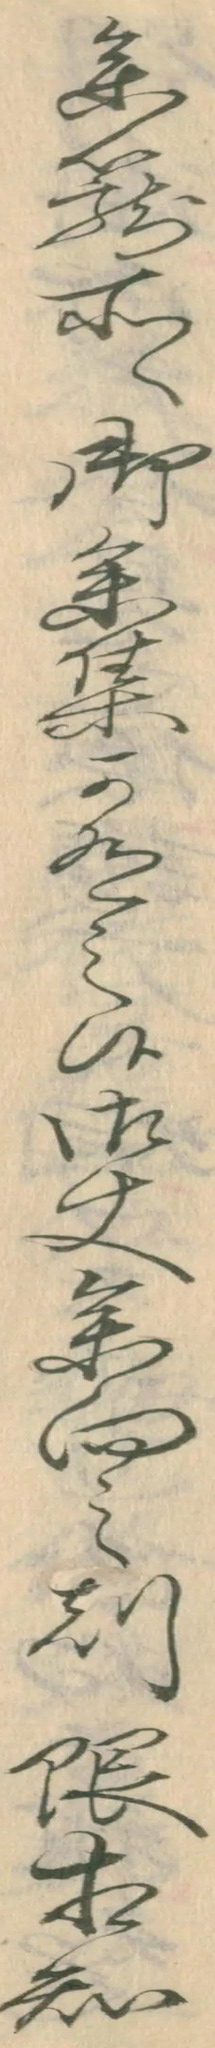参籠所へ御参集可有之候御使参向之刻限相知
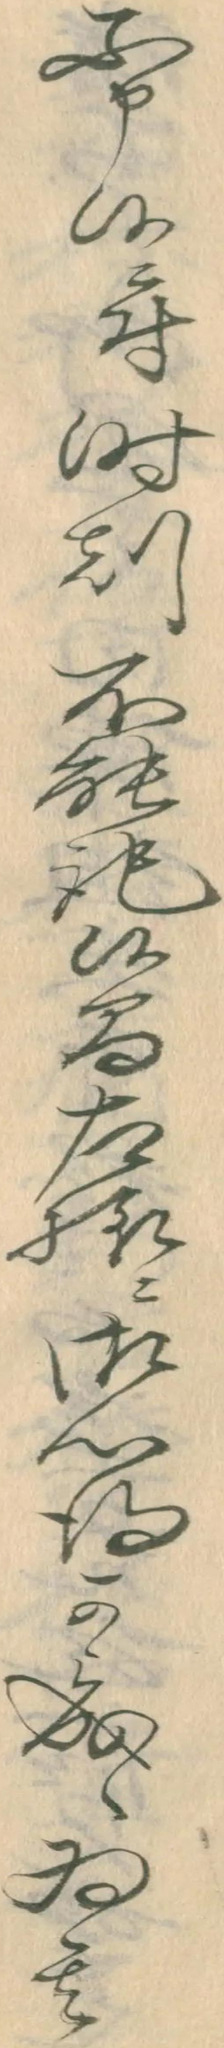不申候二付時刻不能記候間左様二御心得可被成候為其
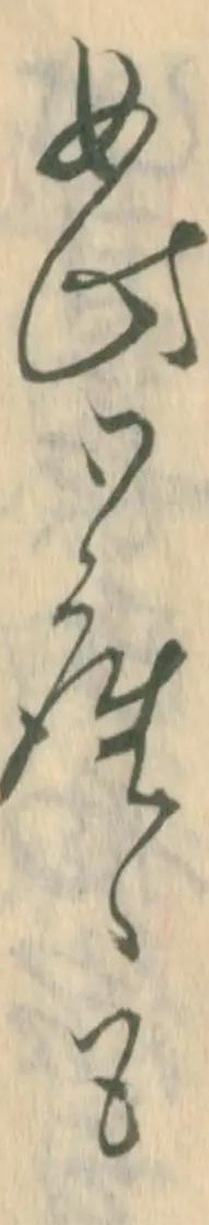如此御座候以上
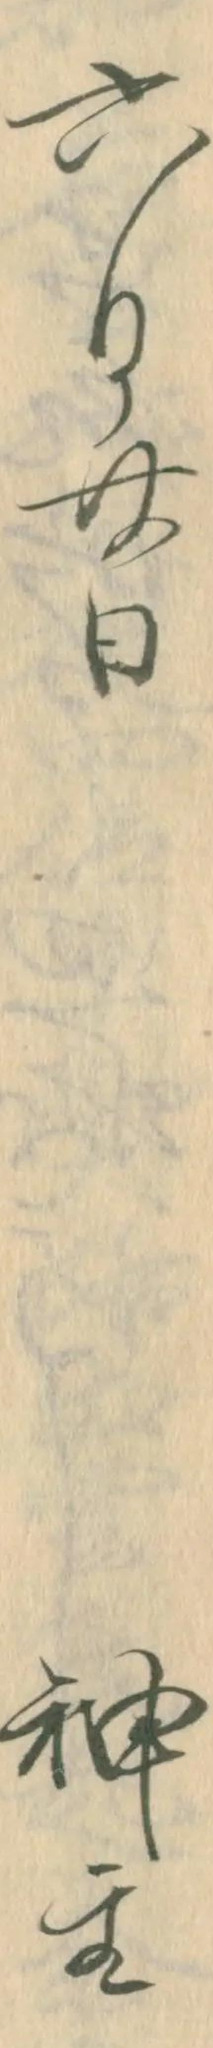六月廿日神主

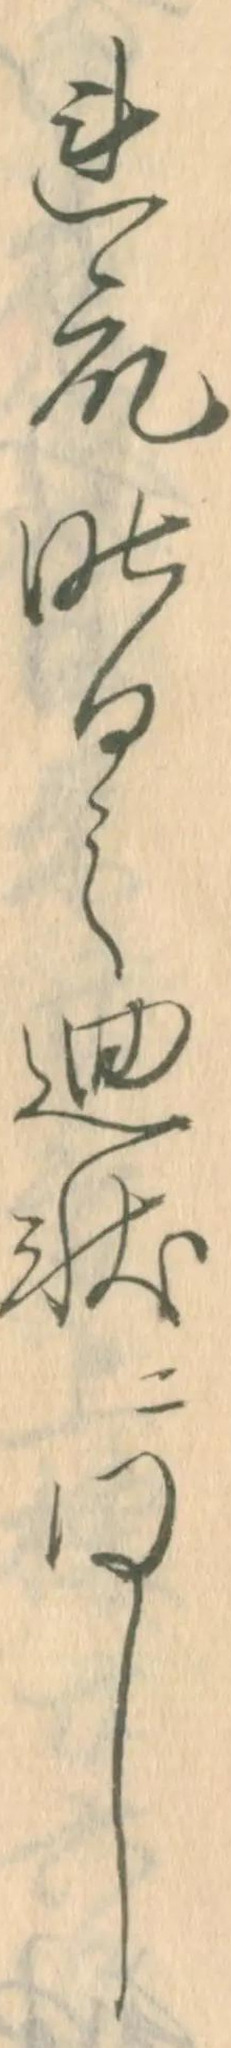連衆昨日之廻状ニ同し
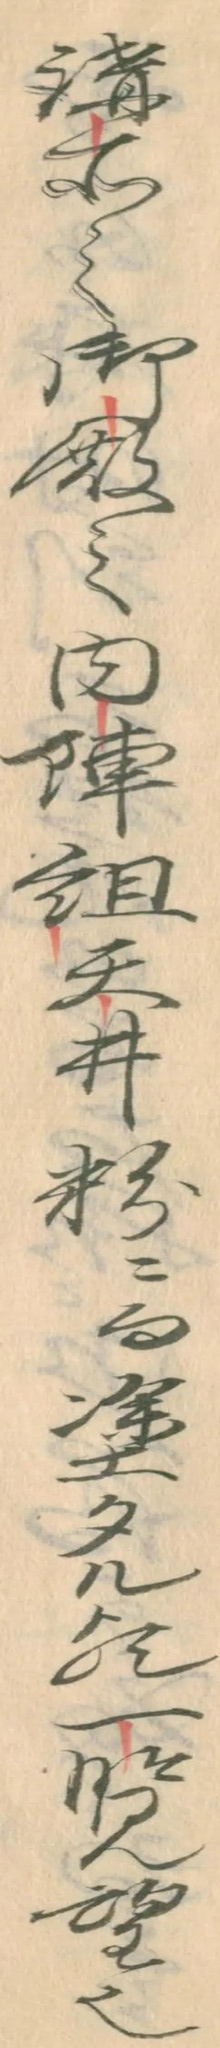講-所之御-殿之内-陣組-井粉ニ而塗タル歟一-覧望也
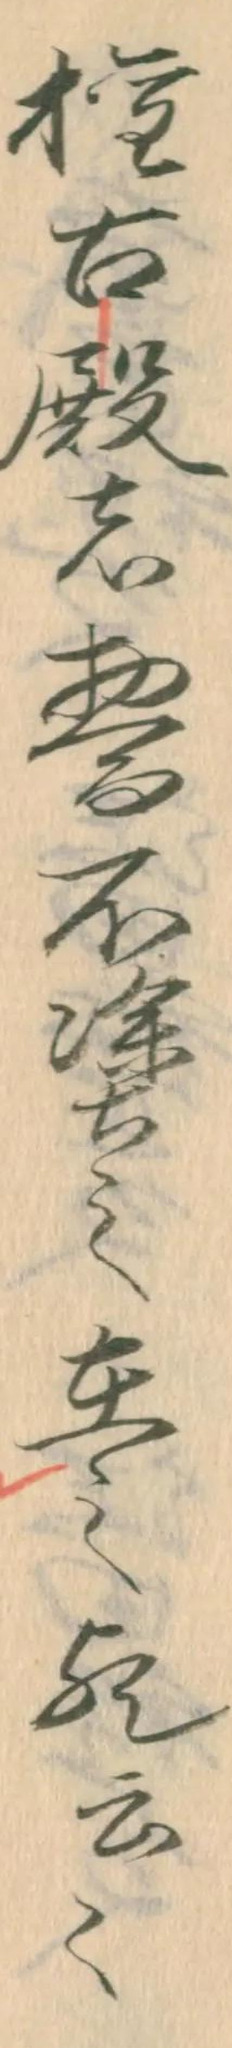権古-殿者惣而不塗之在之歟云々
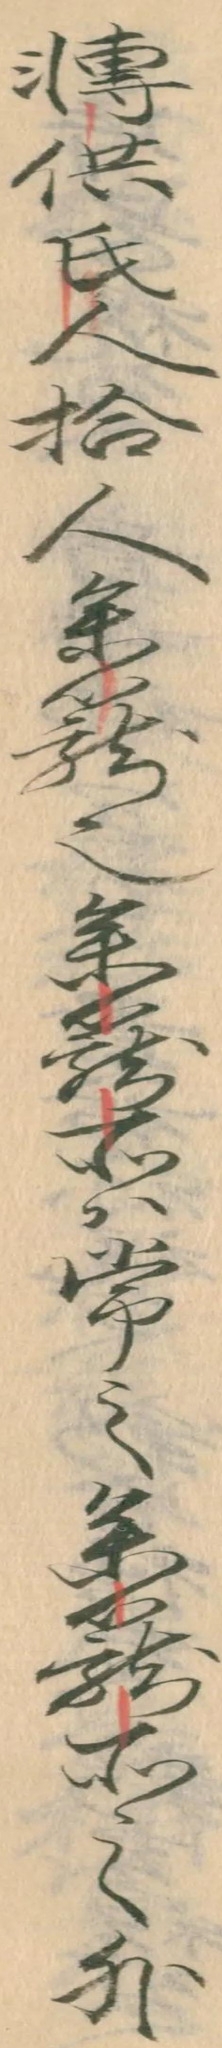転-供氏拾人参-籠也参-籠-所ハ常之参-籠-所之外
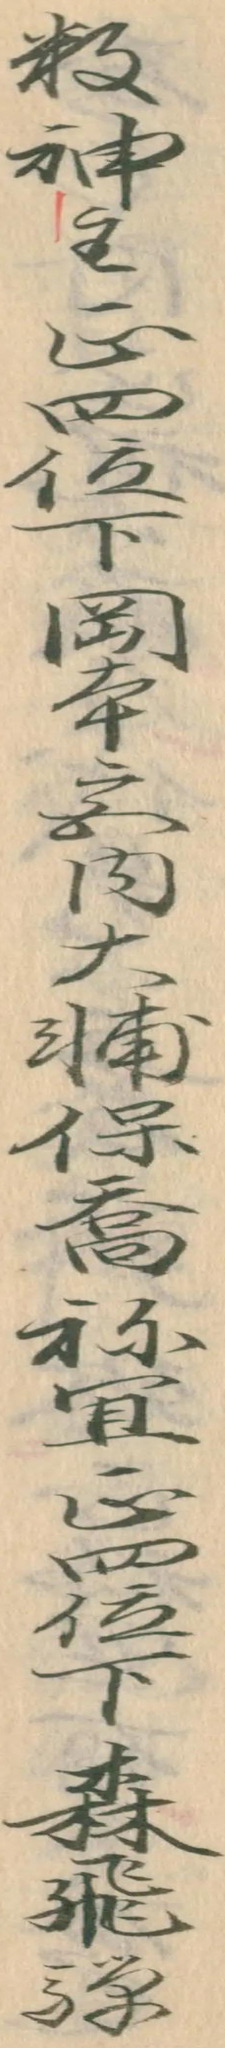数神_主正四位下岡本宮内大輔保喬祢宜正四位下森飛騨
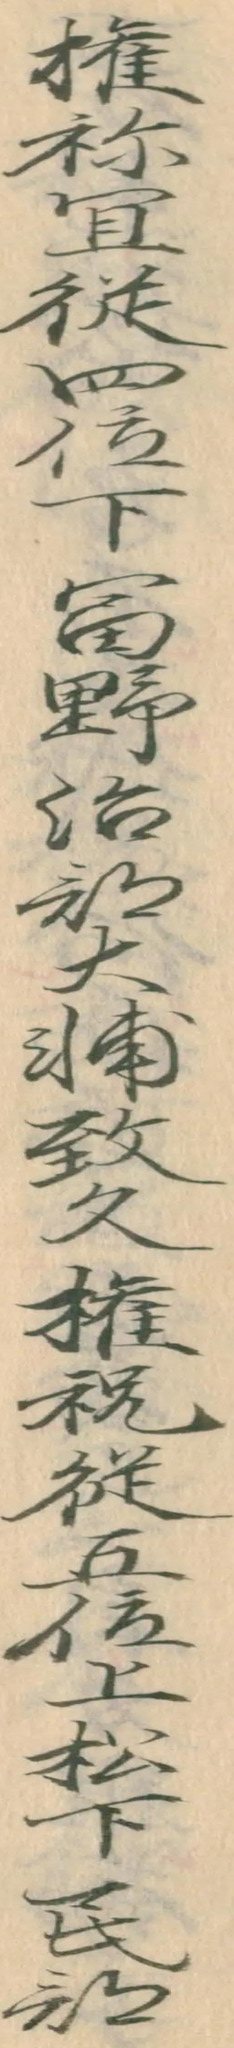権祢宜従四位下冨野治部大輔致久権祝従五位上松下民部
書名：賀茂社記録. 第15冊
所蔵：国立国会図書館 National Diet Library, JAPAN
